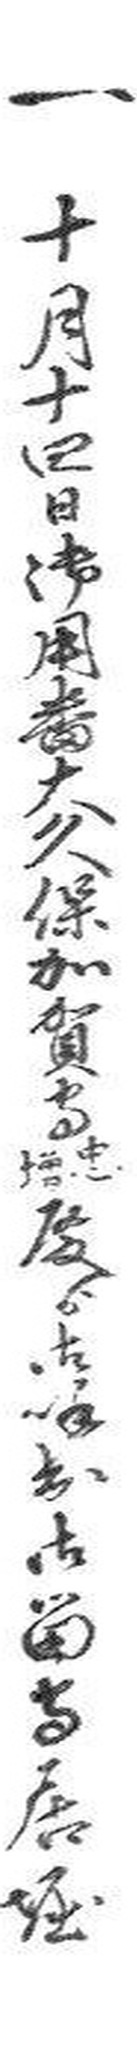一十月十四日御用番大久保加賀守忠増殿ゟ御呼出御留守居堀
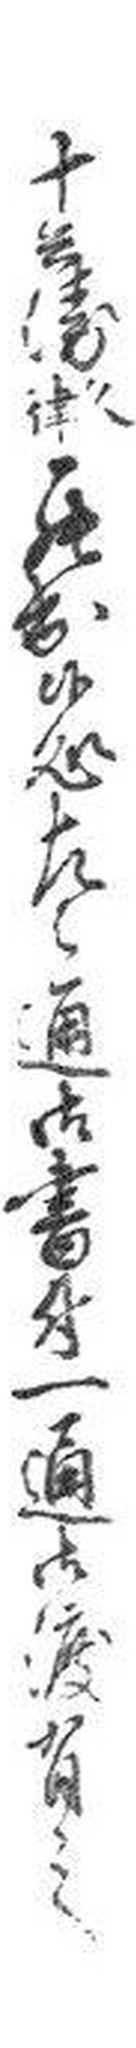十兵衛久律罷出候処左之通御書付一通御渡有之
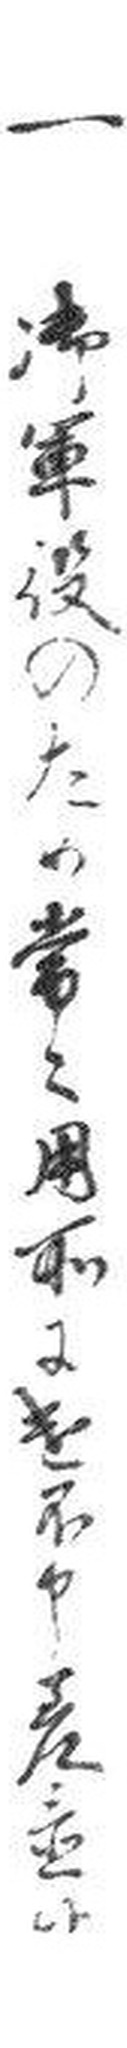一御軍役のため常々用所に遣不申差置候
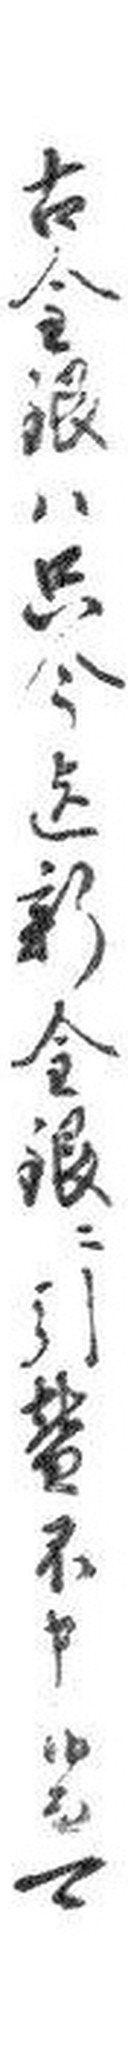古金銀ハ只今迄新金銀ニ引替不申候而可
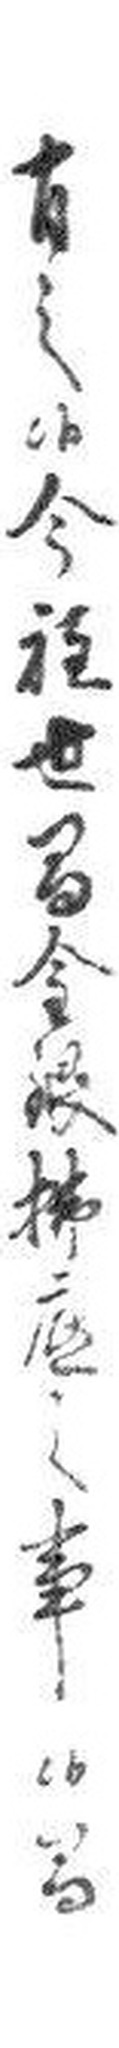有之候今程世間金銀払底之事候間
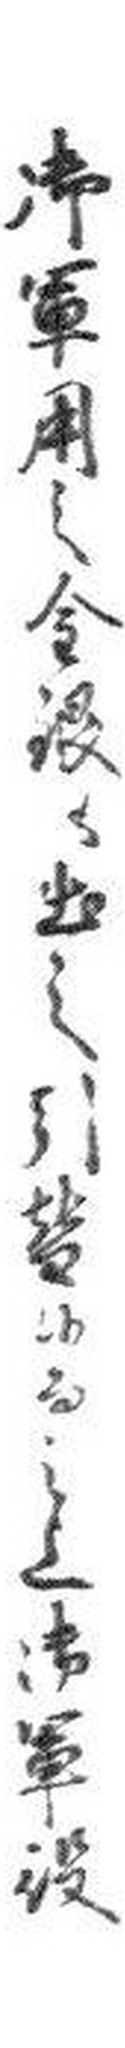御軍用之金銀も出之引替候而之上御軍役
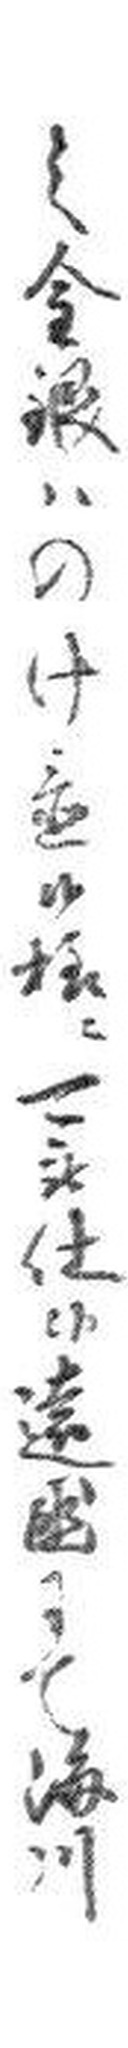之金銀ハのけ置候様ニ可被仕候遠国にて海川
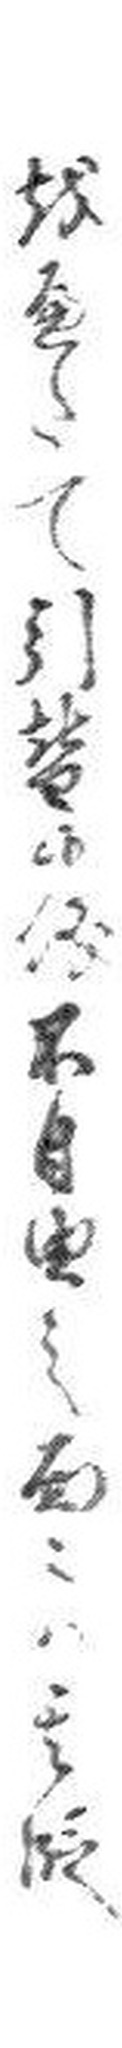をへたて引替候儀不自由之面々ハ其段
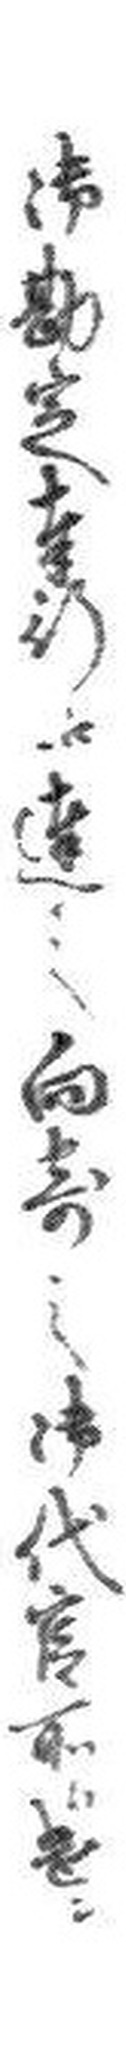御勘定奉行江達之向寄之御代官所江遣シ
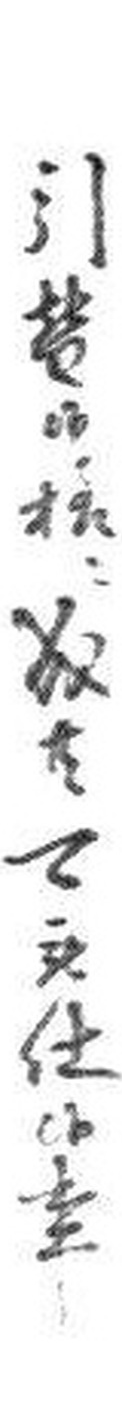引替候様ニ成共可被仕候事
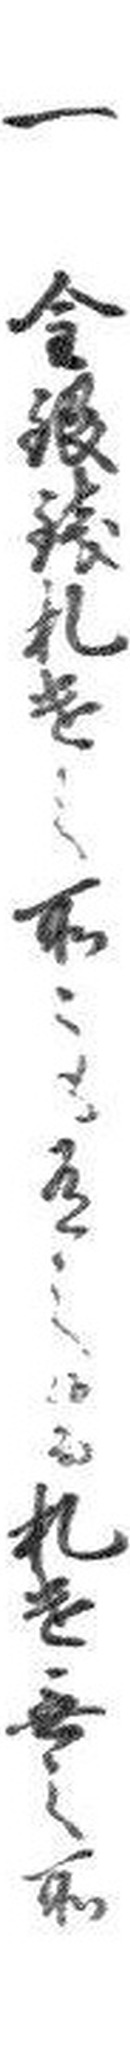一金銀銭札遣之所々も有之候而札遣無之所
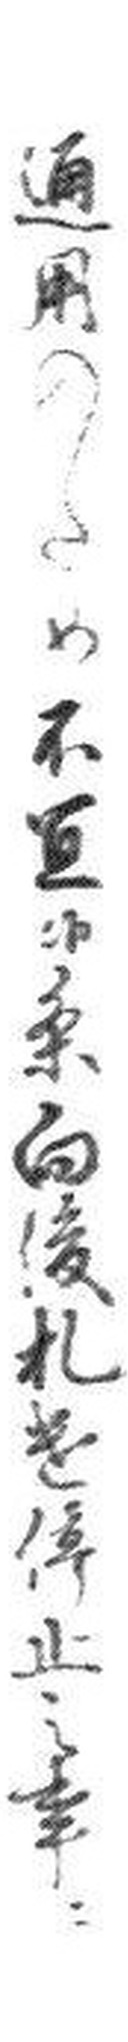通用のため不宜候条向後札遣停止之事ニ
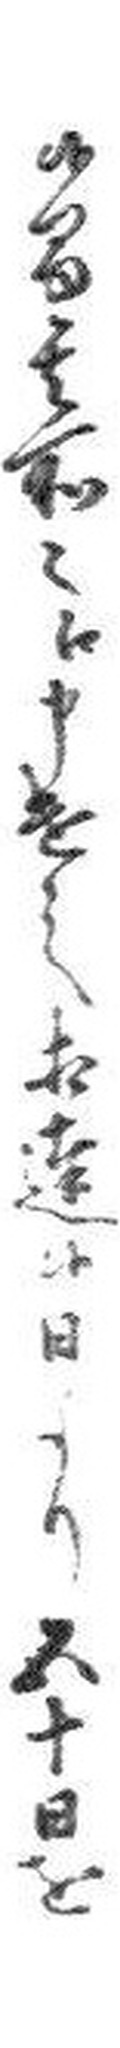候間其所々江申遣之相達候日より五十日を
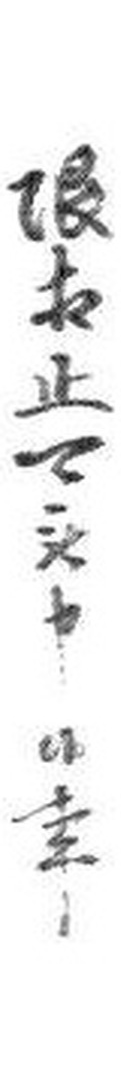限相止可被申候事

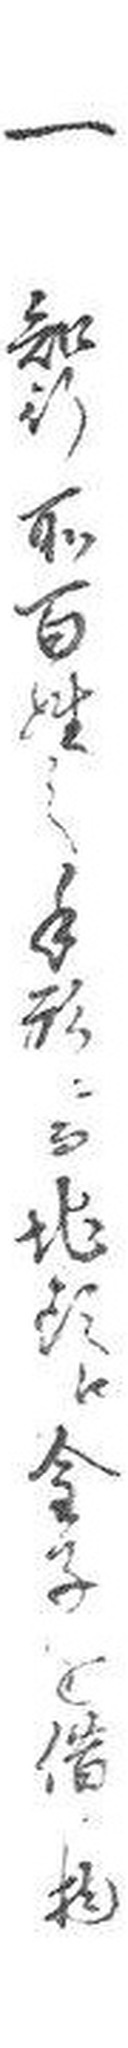一知行所百姓之手形ニ而地頭江金子を借り物
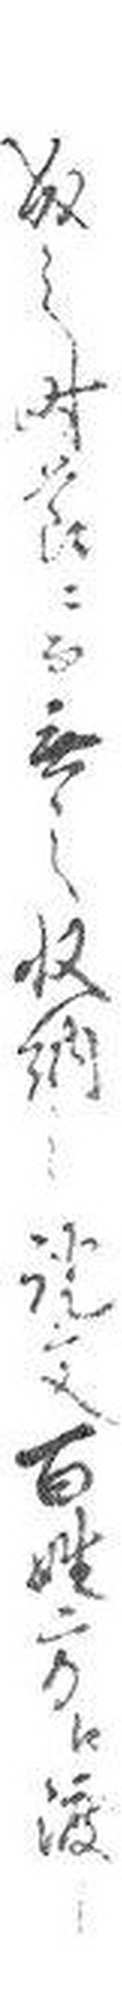成之時節ニ而無之収納之証文百姓方江渡し
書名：家譜 二十四 吉品公 従宝永三年到同五年
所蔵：福井県文書館 Fukui Prefectural Archives
